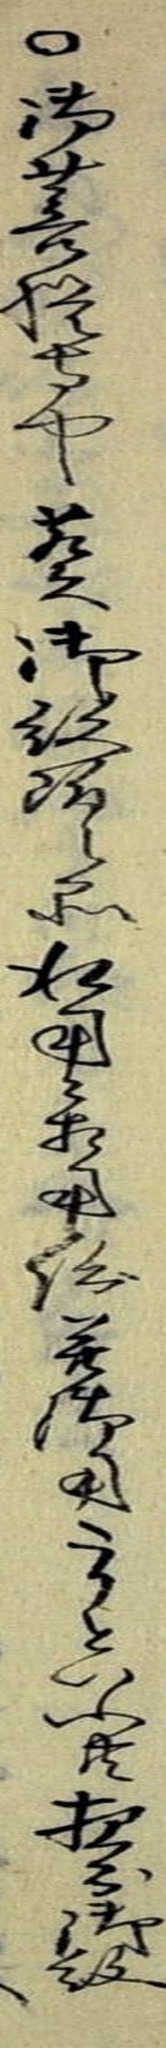〇御菩提寺中葵御紋附之品私用ニ相用儀并御用たりといふ共夜分御紋
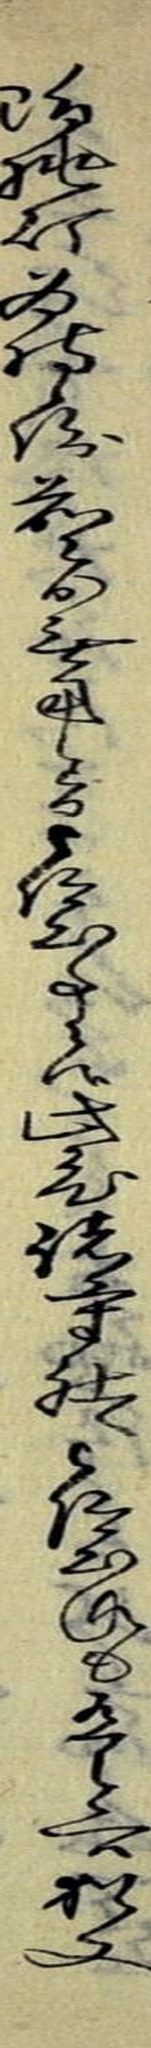附桃灯為持候儀前々ゟ無用之旨被仰出事ニ候此度諸寺社へ被仰出趣も有之候へハ猶又
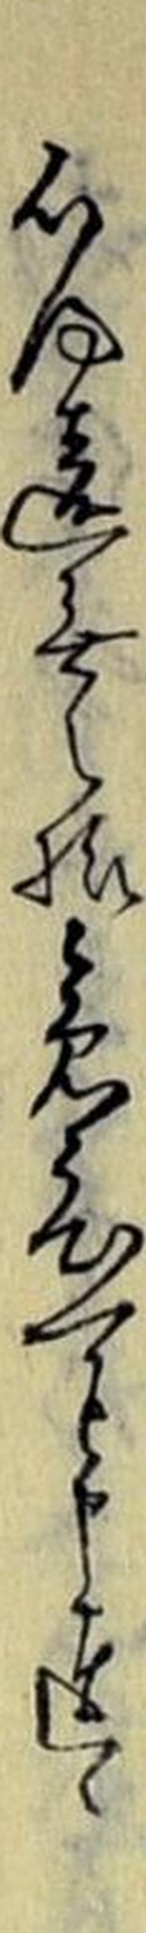心得違無之様急度可被申達候
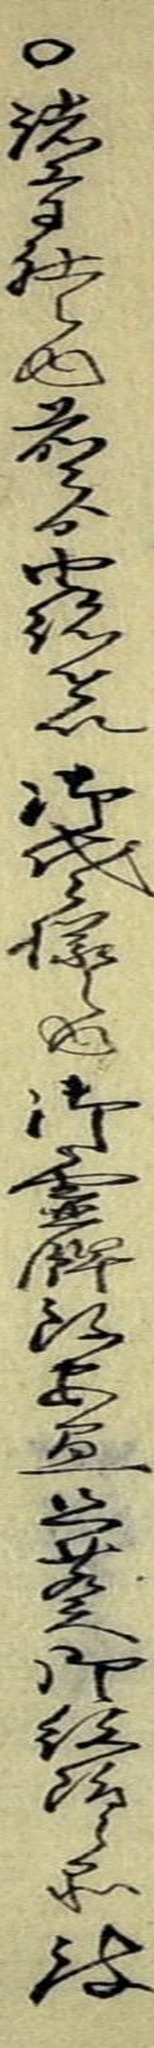〇諸寺社之内前々ゟ由緒を以御代々様之内御霊牌致安置且葵御紋附之品致
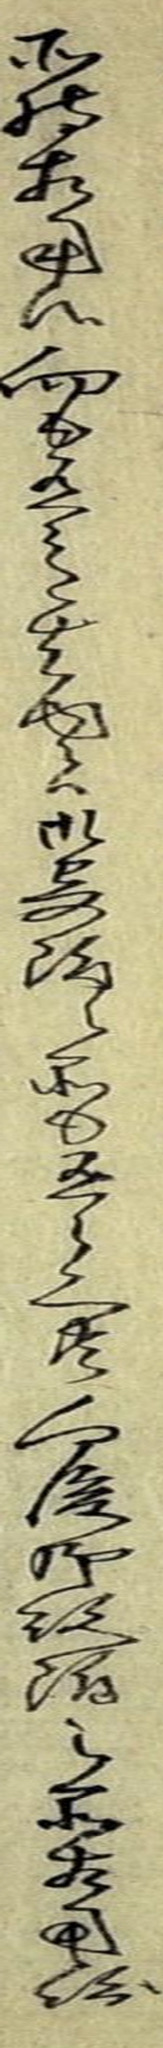所持相用候向も有之候ハヽ内ニハ御寄附之品も有之候へ共向後御紋附之品相用儀
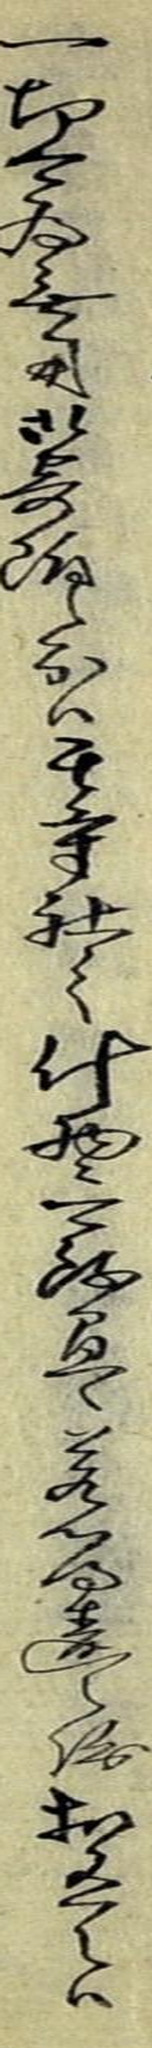一切可為無用御寄附之儀ハ其寺社之什物ニ可致置候若心得違之儀於有之ハ
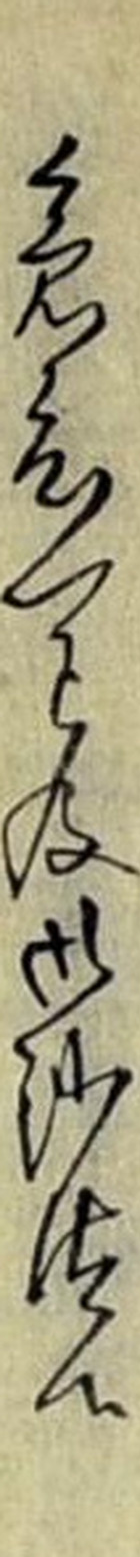急度可被及御沙汰候
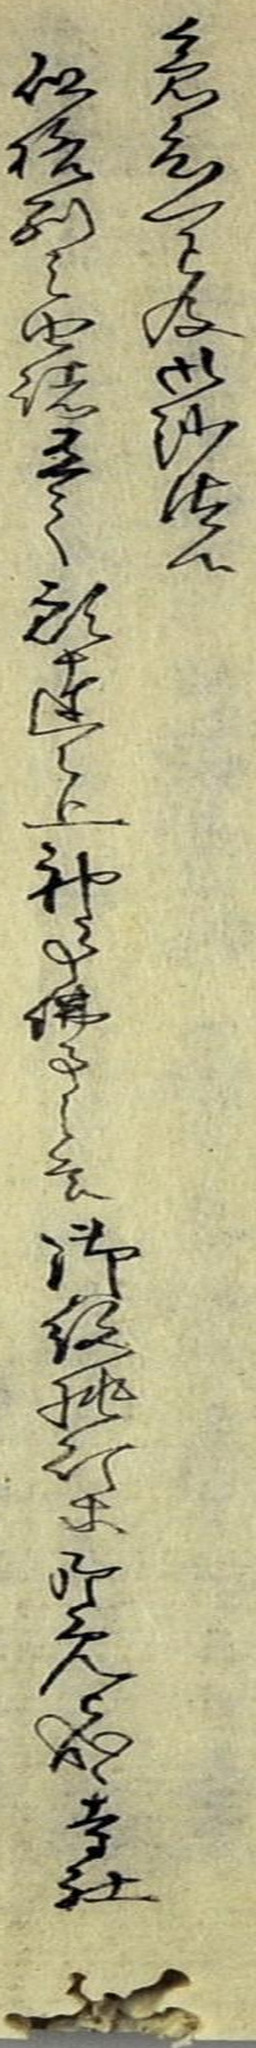但格別之由緒有之願達之上神事仏事之節御紋桃灯等御免被成候寺社
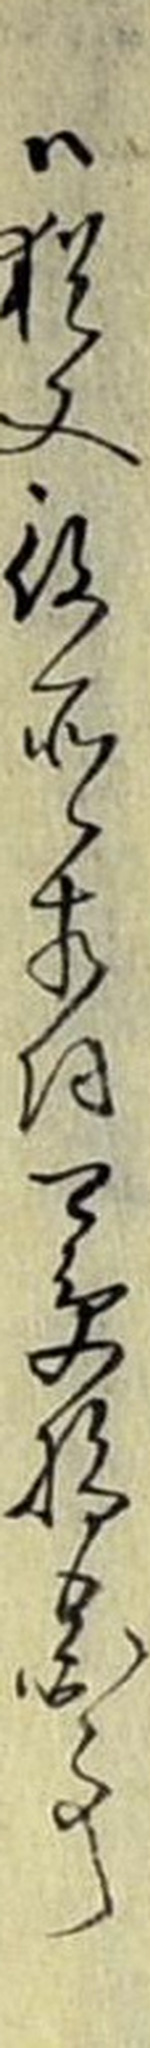ハ猶又役所へ相伺可受指図事
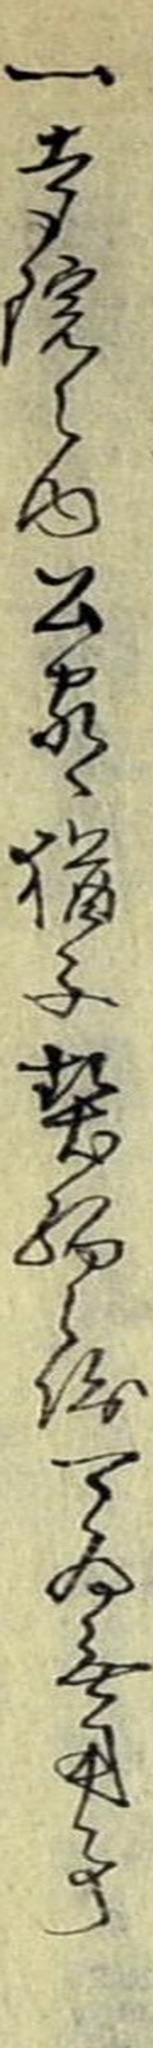一寺院之内公家へ猶子契約之儀可為無用事
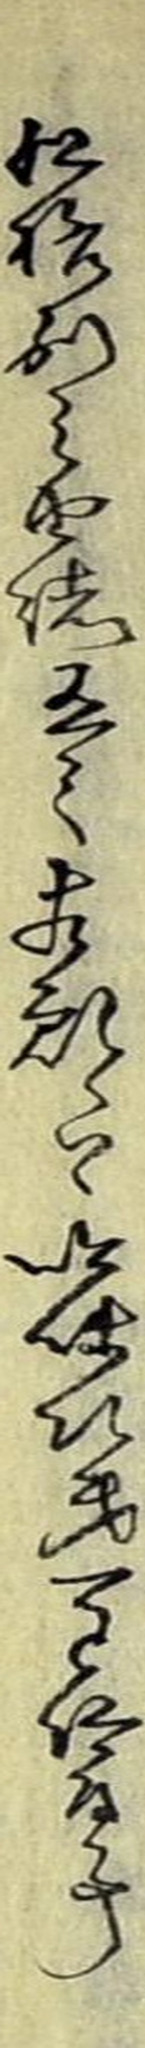但格別之由緒有之相願候ハヽ吟味次第可被仰付事
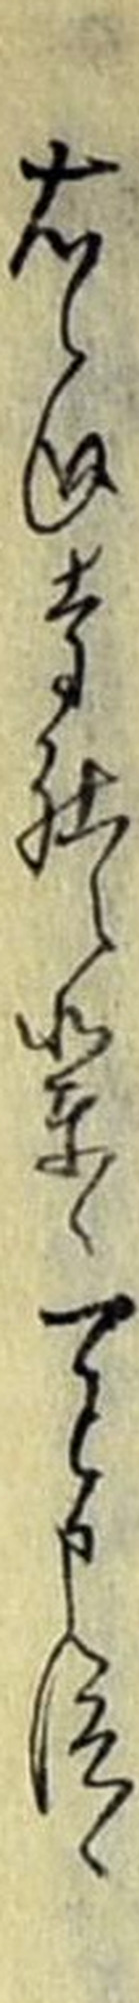右之趣寺社之輩へ可被申渡候
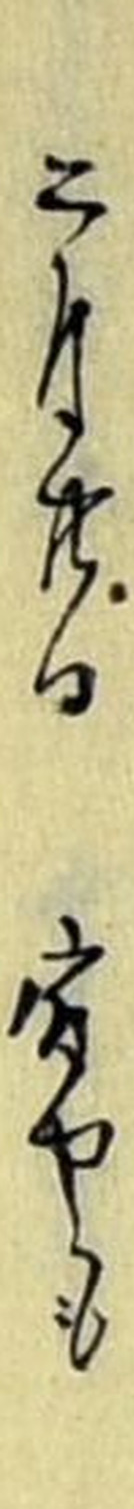二月廿日府中へも

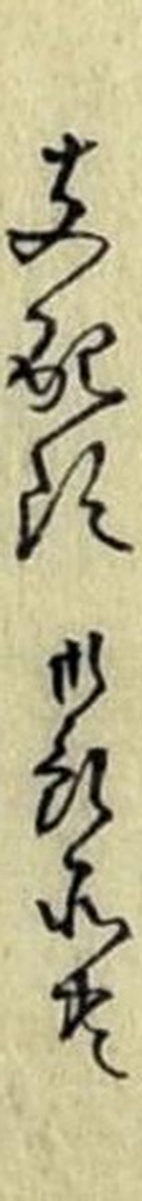支配頭御領所共
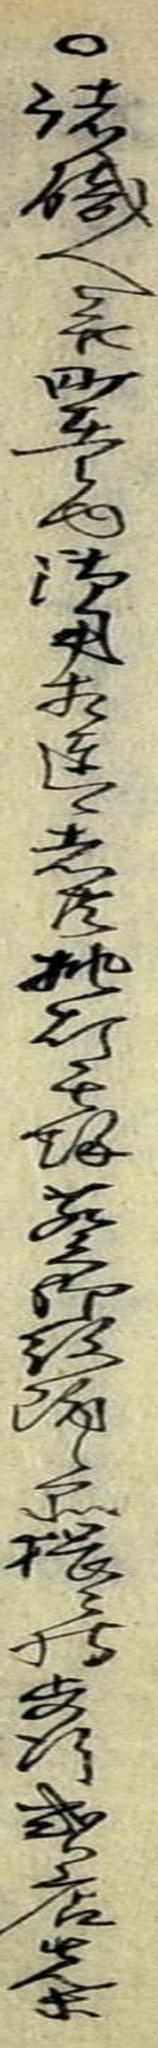〇諸職人并町在之内御用相達候者共桃灯其余葵御紋附之品猥ニ持歩行或ハ店先等
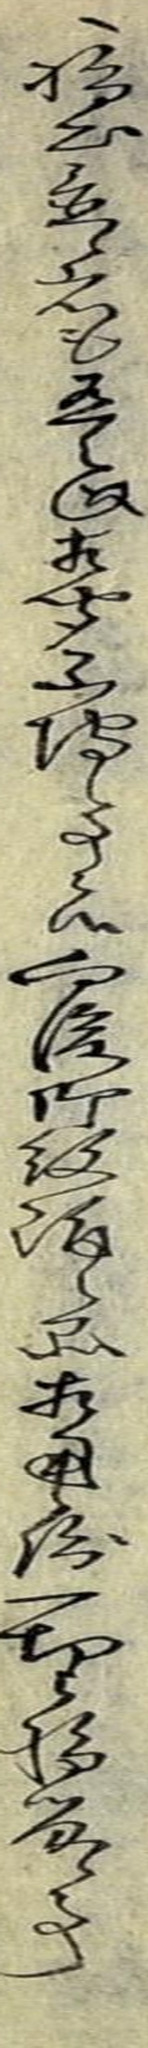へ指出置候者も有之趣相聞不埒之事ニ候向後御紋附之品相用候儀一切被指留候事
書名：命令之部 五
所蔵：福井県文書館 Fukui Prefectural Archives
